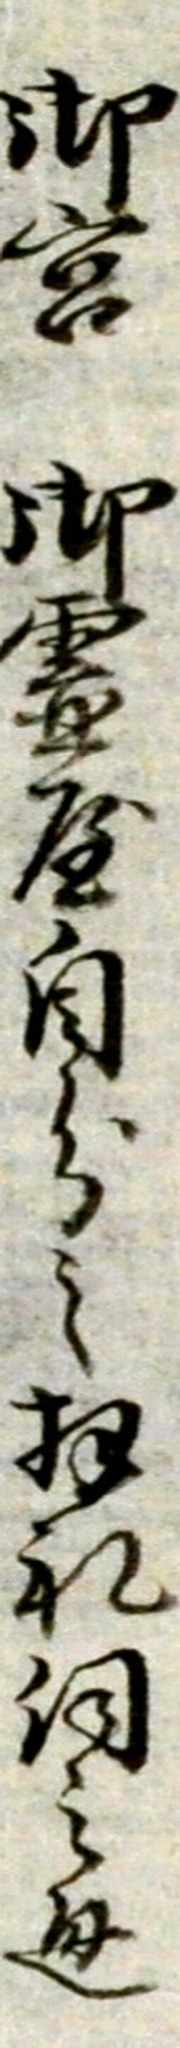御宮御霊屋自分之拝礼伺之通
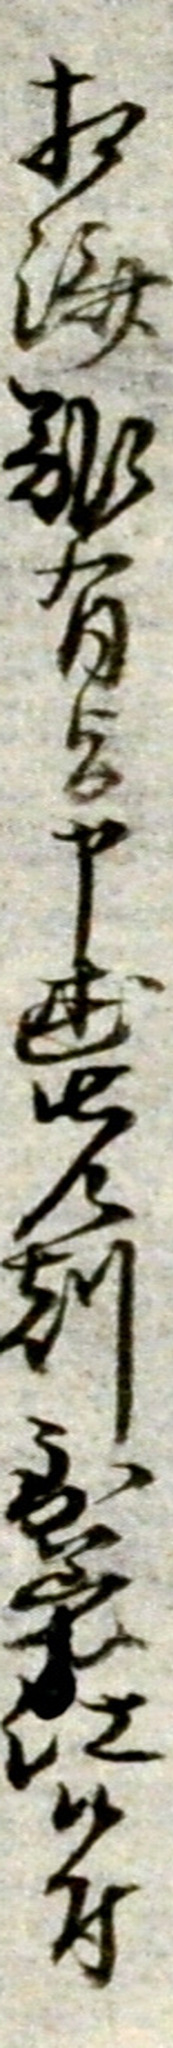相済難有旨申述先刻到着仕候
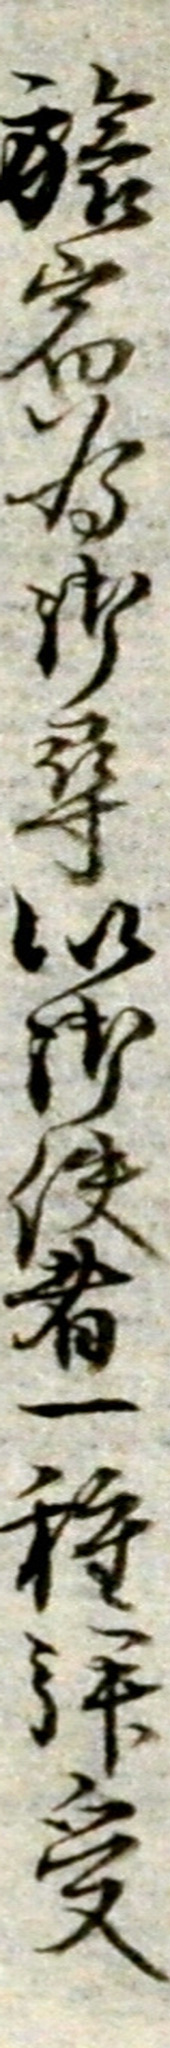旅宿為御尋以御使者一種拝受
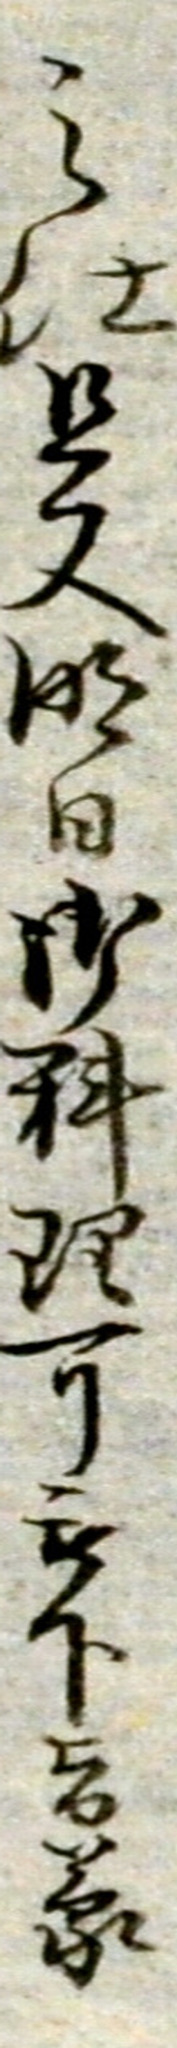之仕且又明日御料理可被下旨蒙
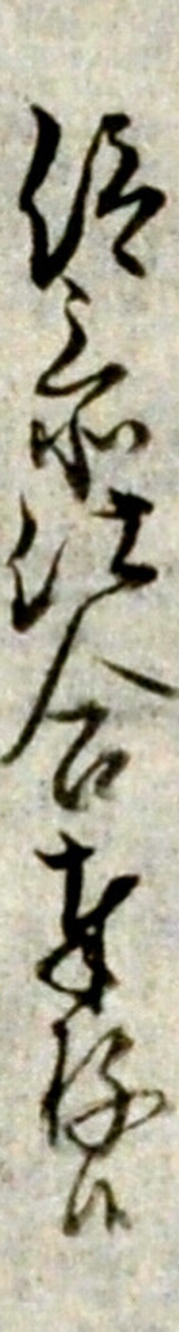仰忝仕合奉存候
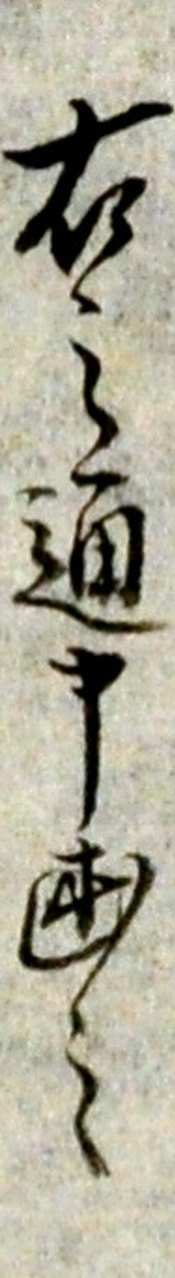右之通申述之
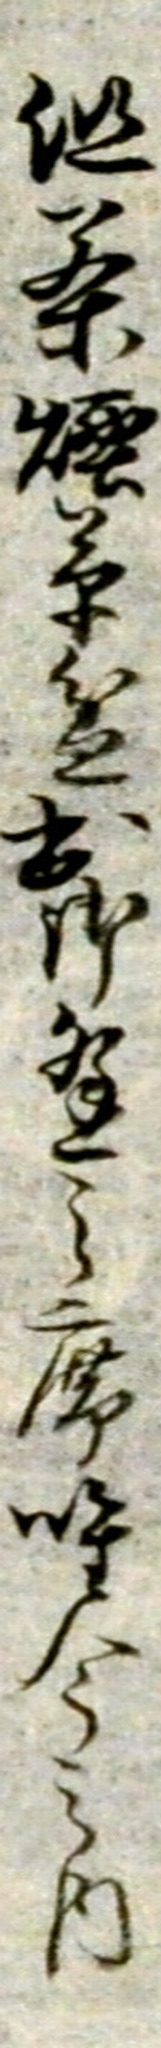但茶煙草盆出御逢之席唯今之内
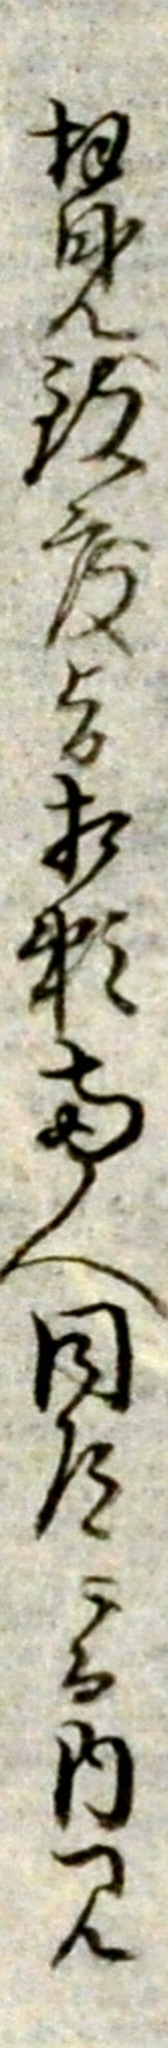拝見致度旨相頼両人同道ニ而内見
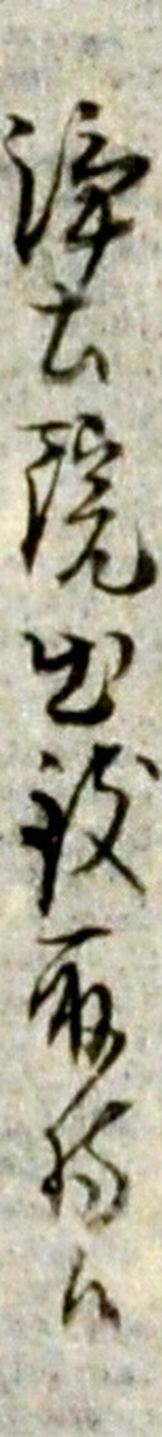浄土院出致取持候
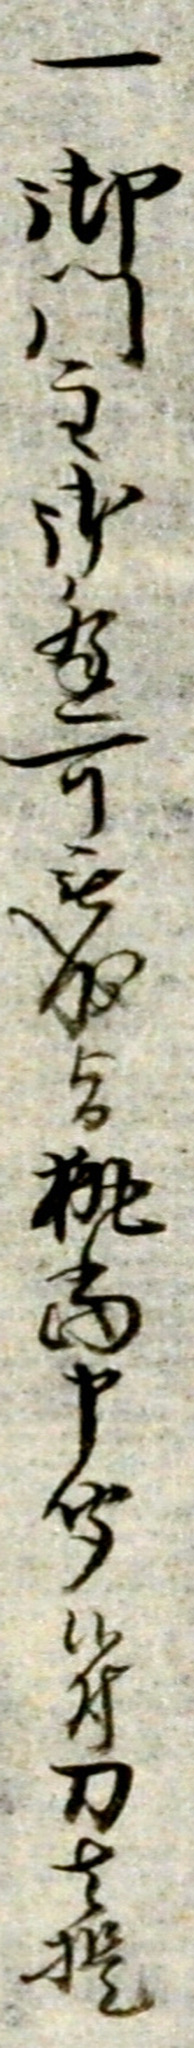一御門主御逢可被成旨執当申聞候付刀者提
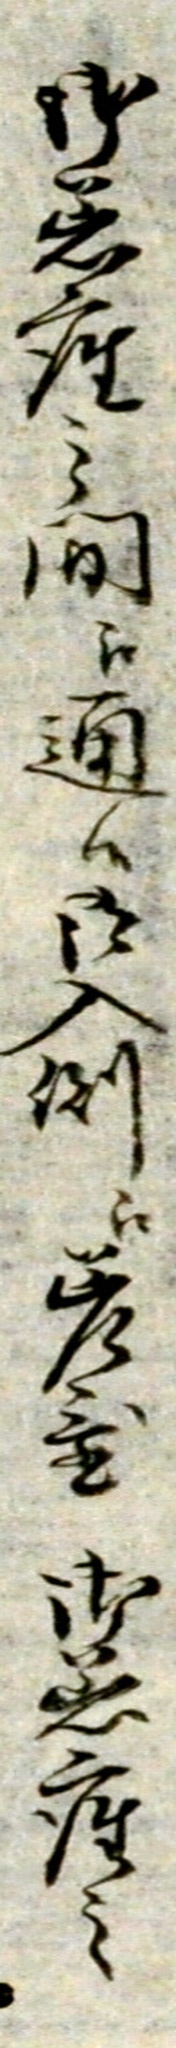御着座之間江通候御入側江差置御着座之
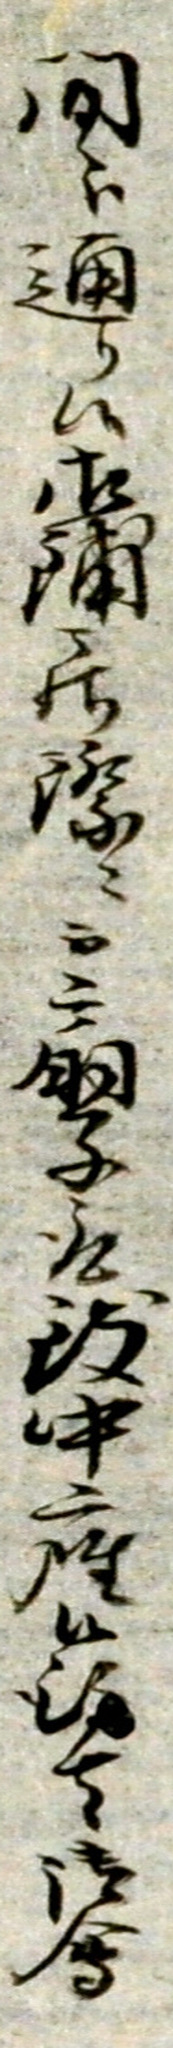間江通り候御鋪居際ニ而扇子取致中御座候得者御会
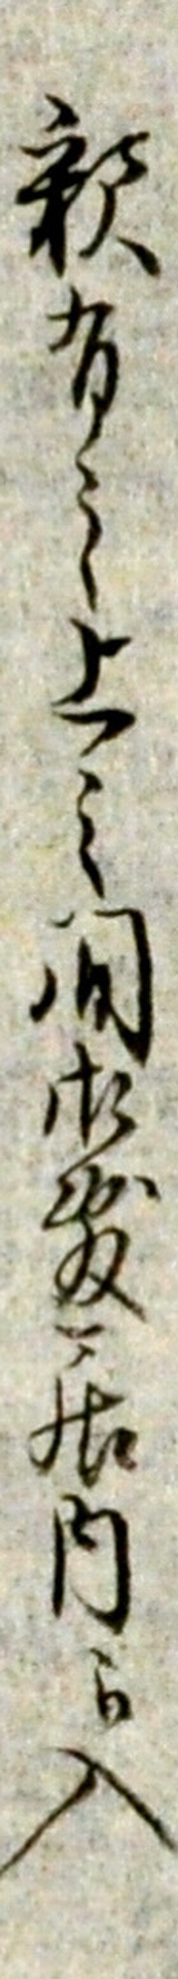釈有之上之間御敷居内江入
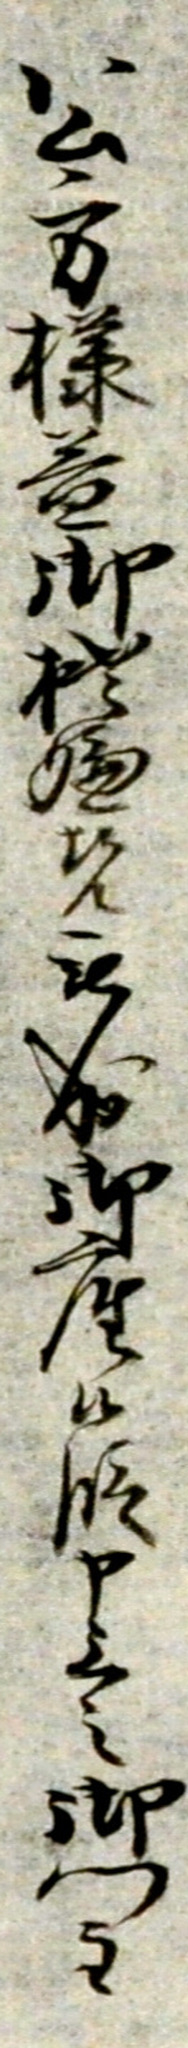公方様益御機嫌克被成御座候段申上之御門主
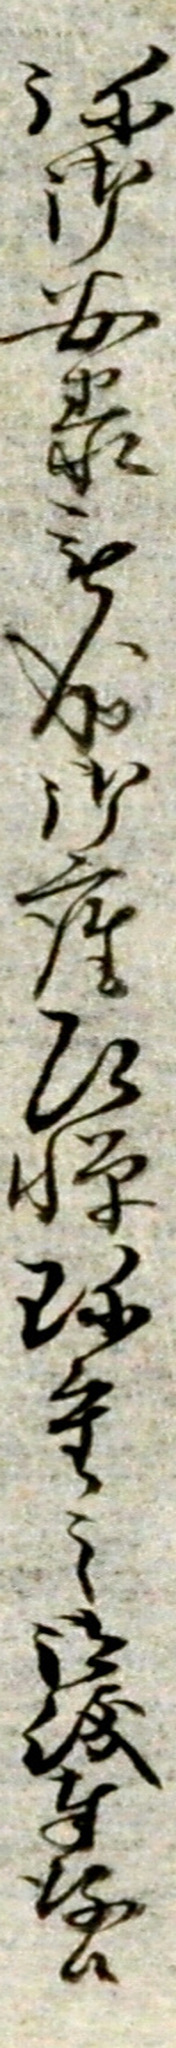弥御安泰被成御座乍憚珍重之御儀奉存候
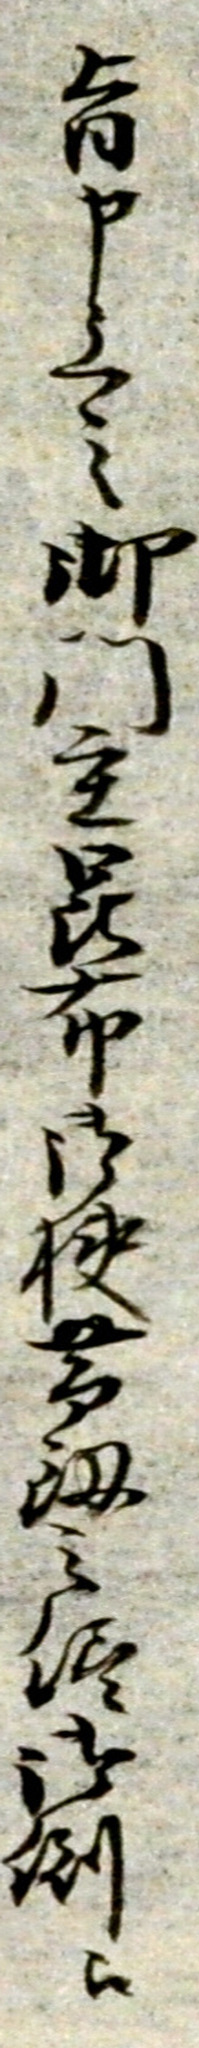旨申上之御門主昆布御挟帯剣之儘御側江
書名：日光御名代相勤候節ノ留
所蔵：伊那市立高遠町図書館・合同会社AMANE
